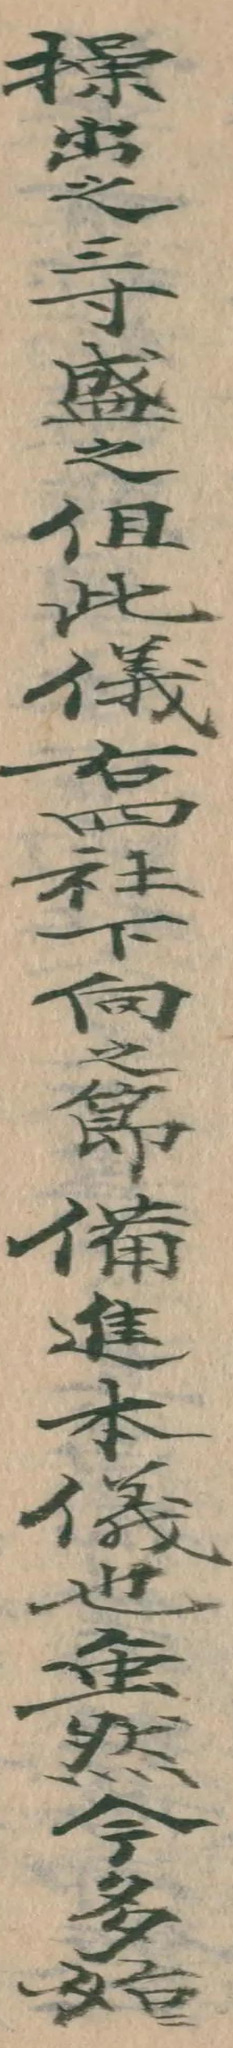操出之三寸盛之但此儀右四社下向之節備進本儀也雖然今多始ニ
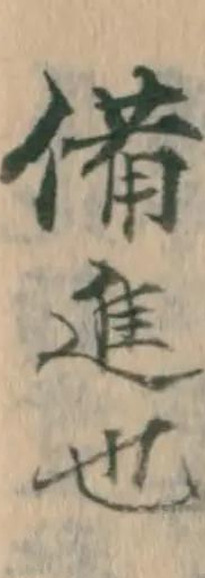備進也
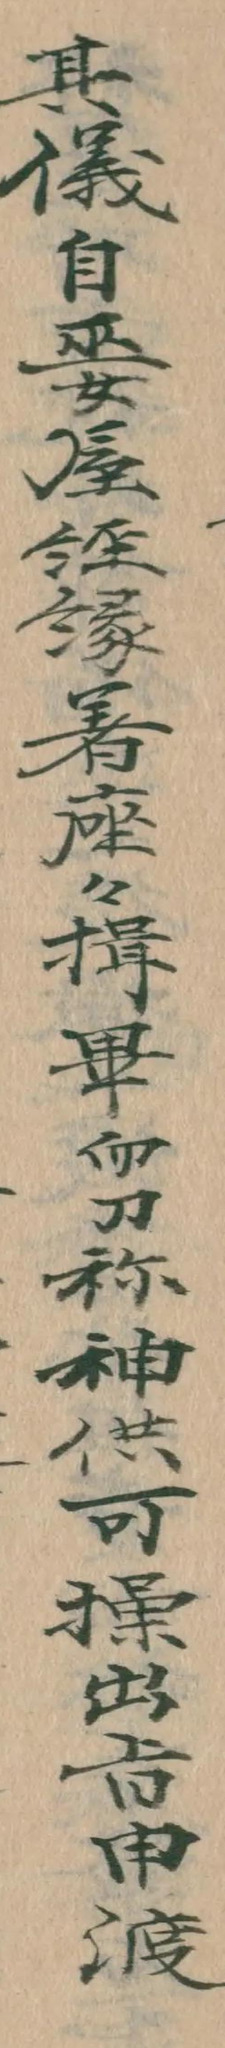其儀自巫女屋経縁着座々揖畢而刀祢神供可操出旨申渡

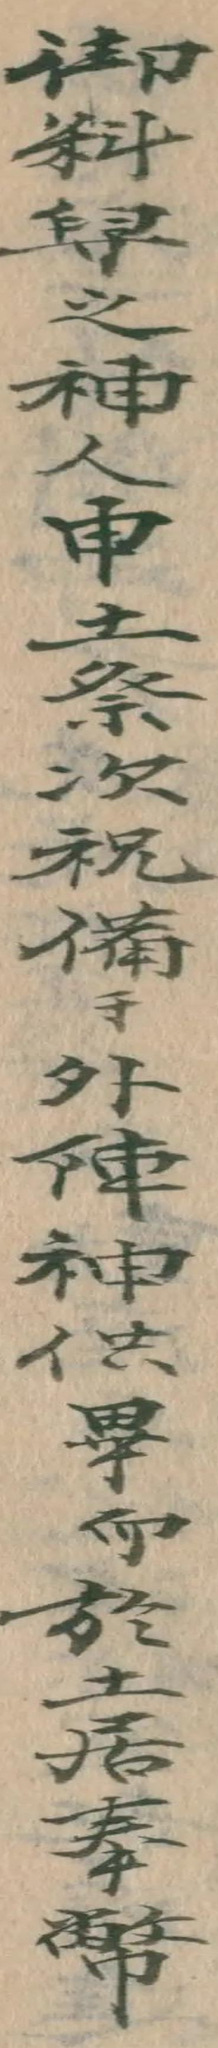御料舁之神人申土祭次祝備于外陣神供畢而於土居奉幣
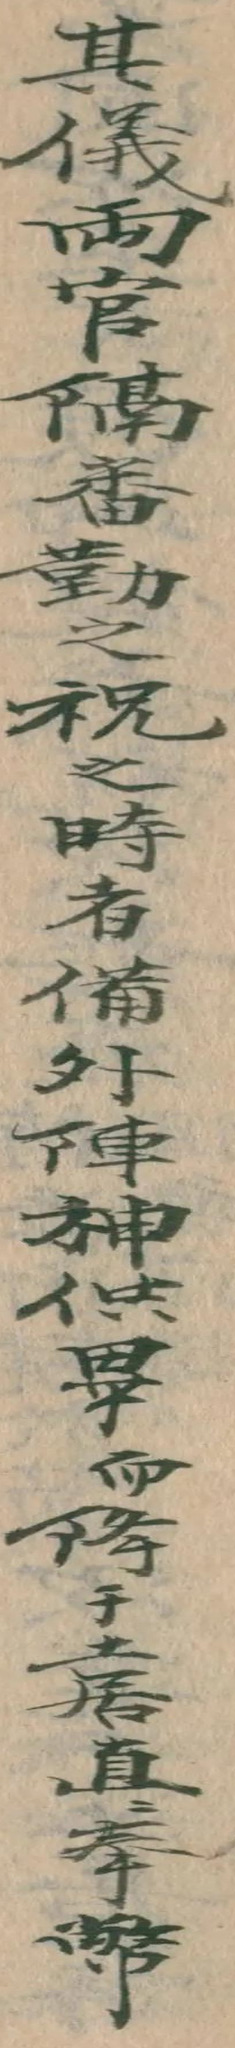其儀両官隔番勤之祝之時者備外陣神供畢而降于土居直ニ奉幣
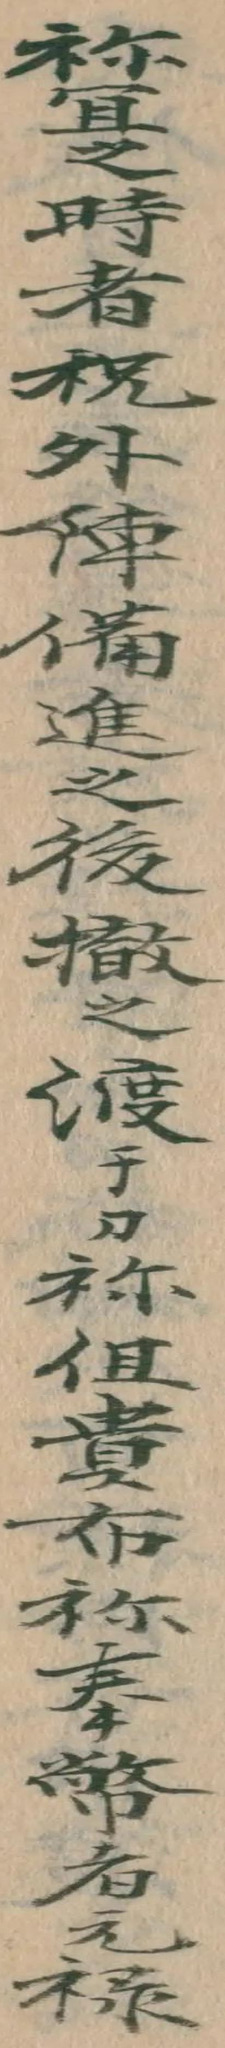祢宜之時者祝外陣備進之後撤之渡于刀祢但貴ふね奉幣者元禄
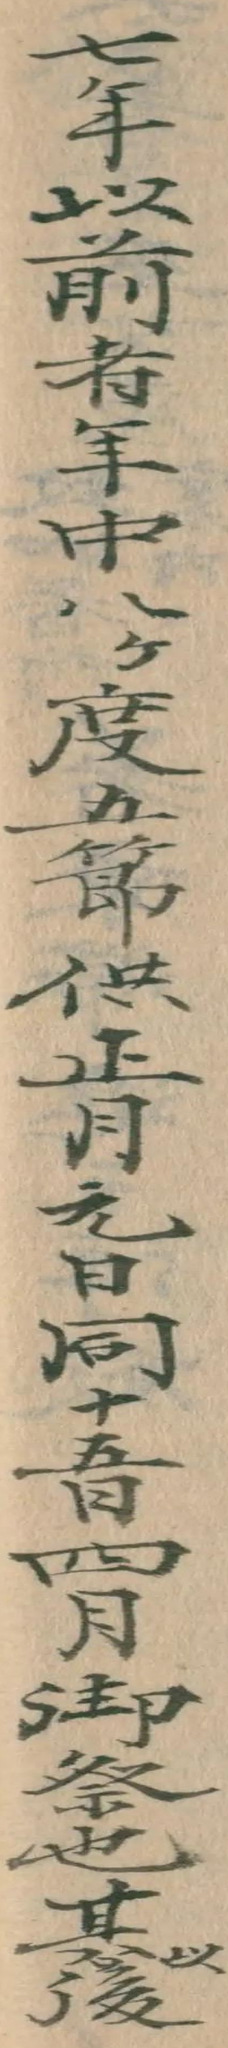七年以前者年中八ヶ度五節供正月元日同十五日四月御祭也其◦後
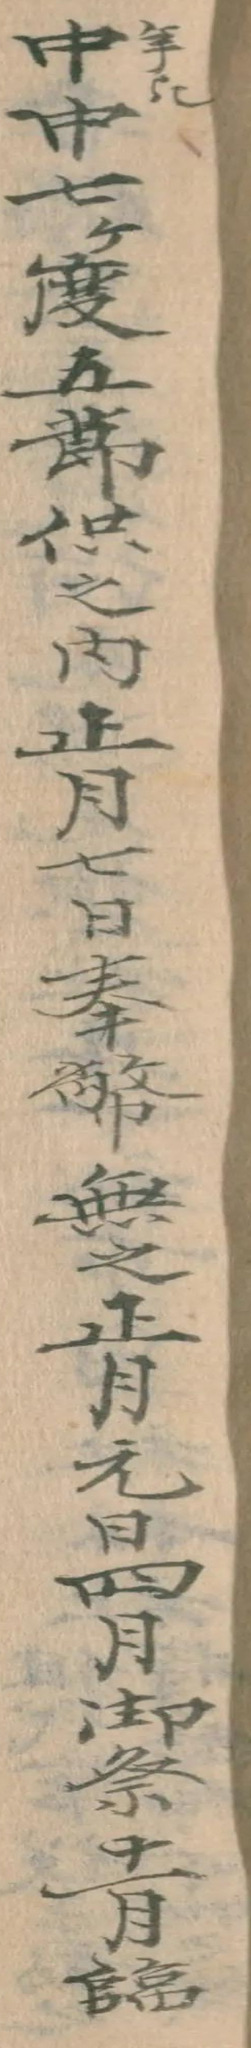中中七ケ度五節供之内正月七日奉幣無之正月元日四月御祭十一月臨
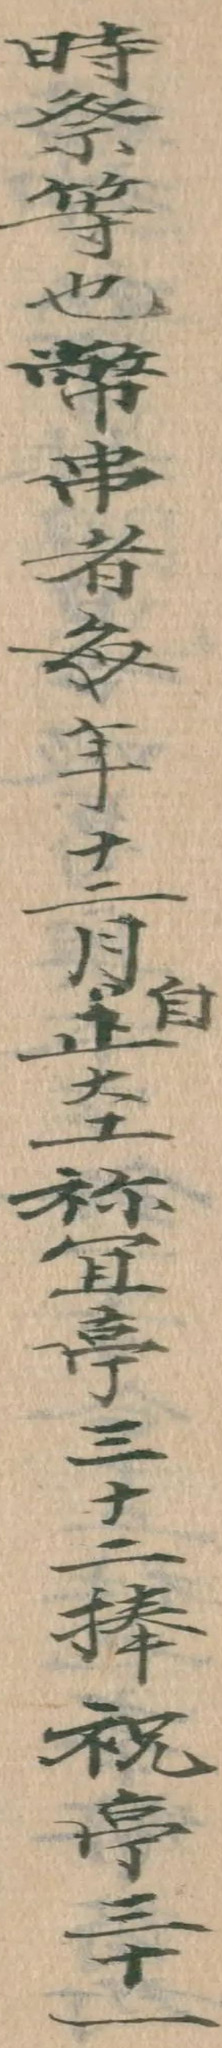時祭等也幣串者毎年十二月◦正大工祢宜亭三十二棒祝亭三十一
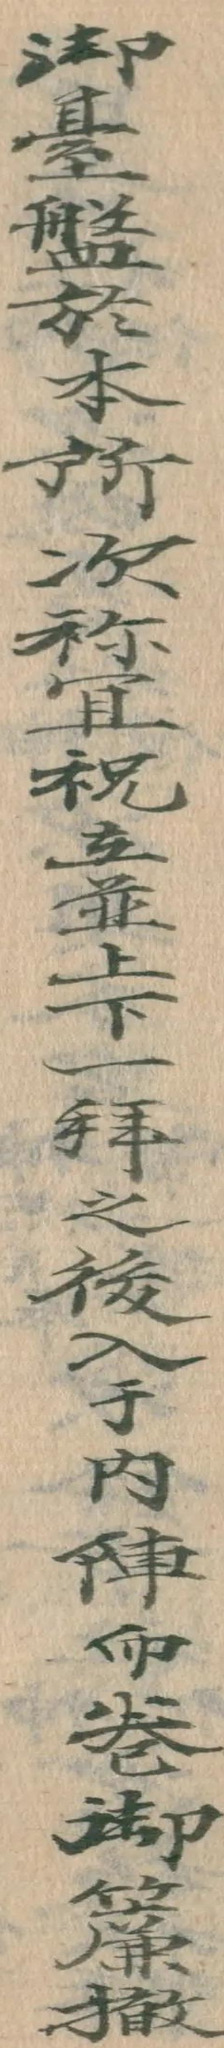御台盤於本所次祢宜祝立並上下一拝之後入于内神而巻御簾撤
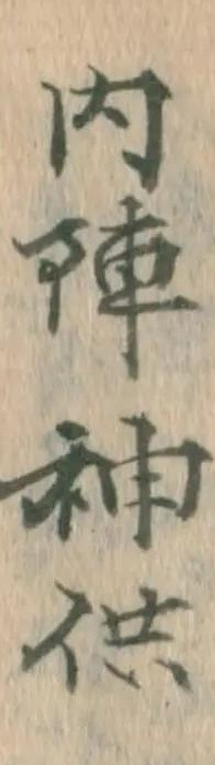内陣神供
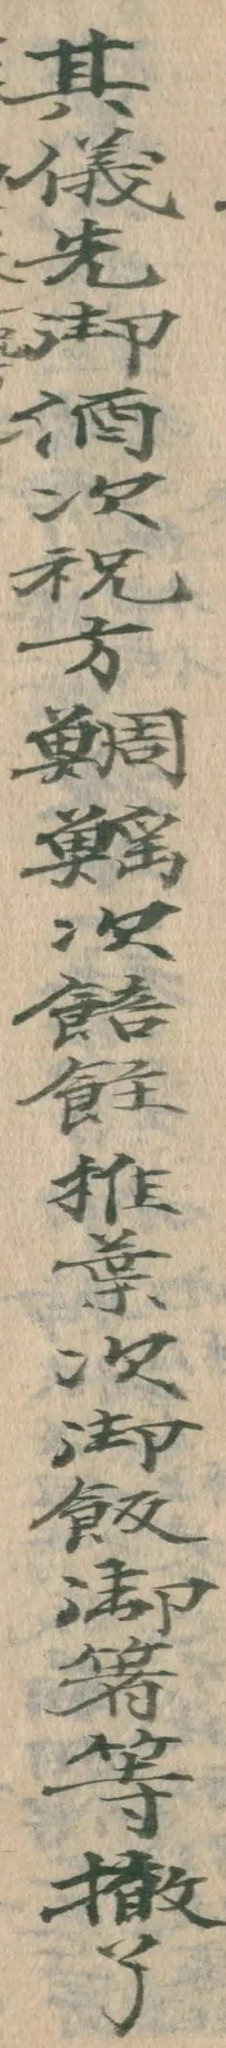其儀先御酒次祝方鯛鰩次餢飳椎葉次御飯御箸等撤了
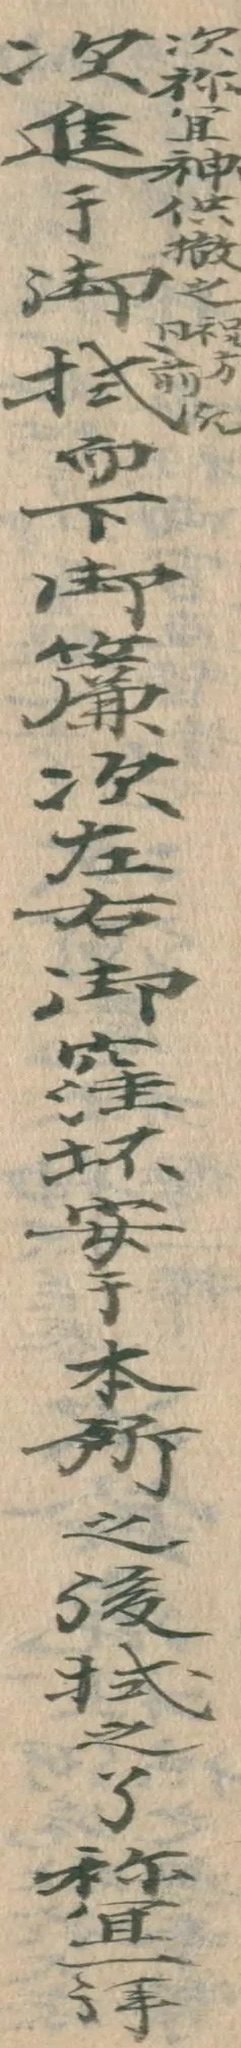次進于御拭而下御簾次左右御窪坏安于本所之後拭之了祢宜一拝

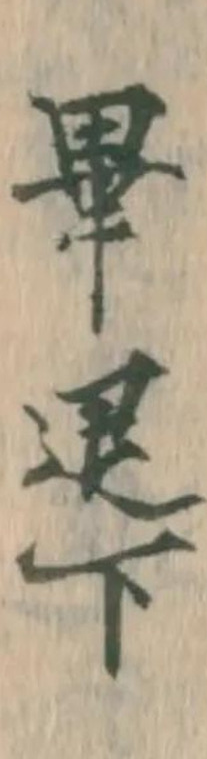畢退下
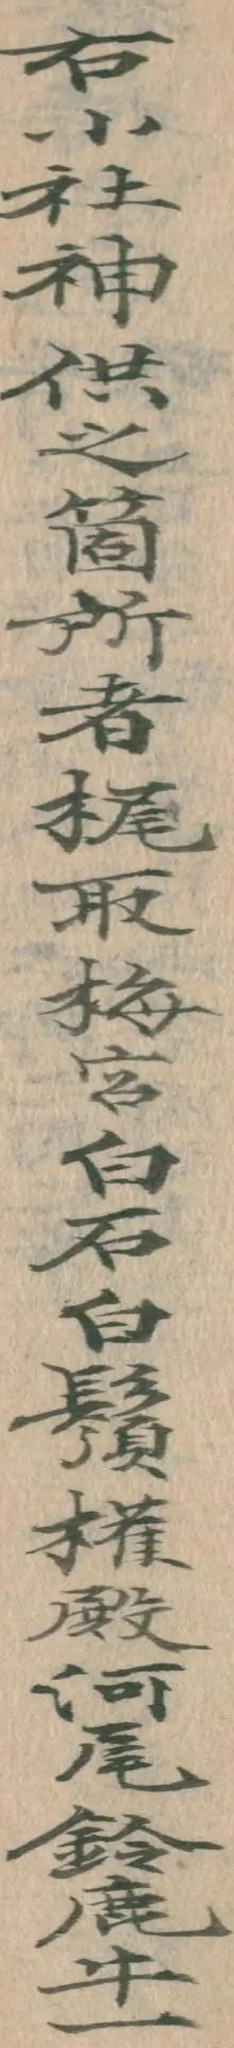右小社神供之箇所者梶取梅宮白石白鬚権殿河尾鈴鹿牛一
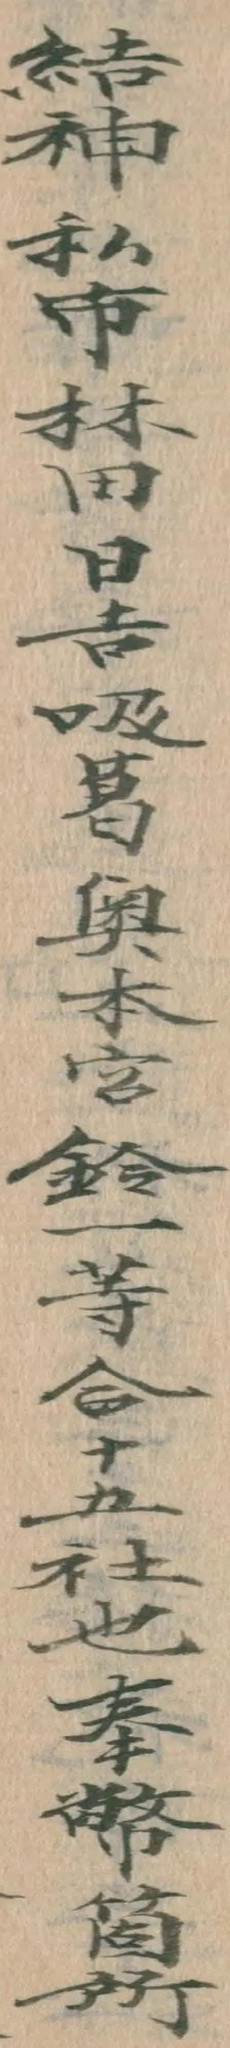結神私市林田日吉吸葛奥本宮鈴一等合十五社也奉幣箇所
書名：賀茂社記録. 第9冊
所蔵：国立国会図書館 National Diet Library, JAPAN
